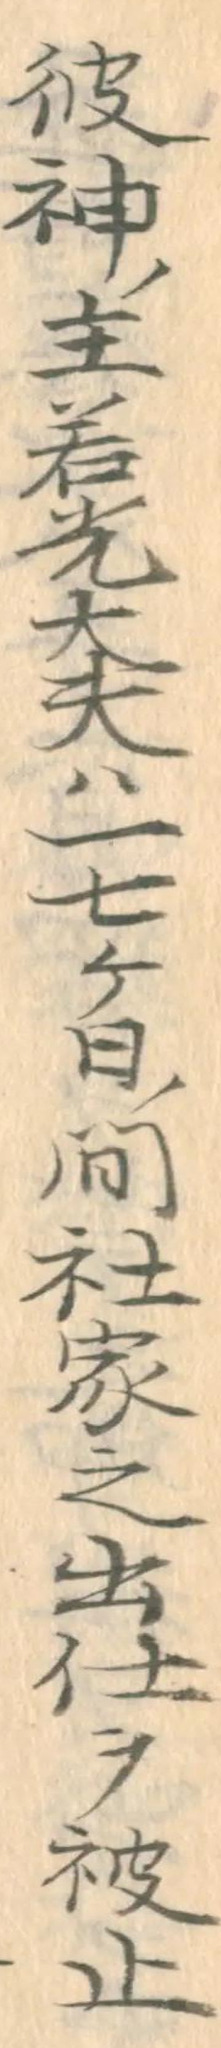彼神ノ主若光大夫ハ一七ケ日ノ間社家之出仕ヲ被止
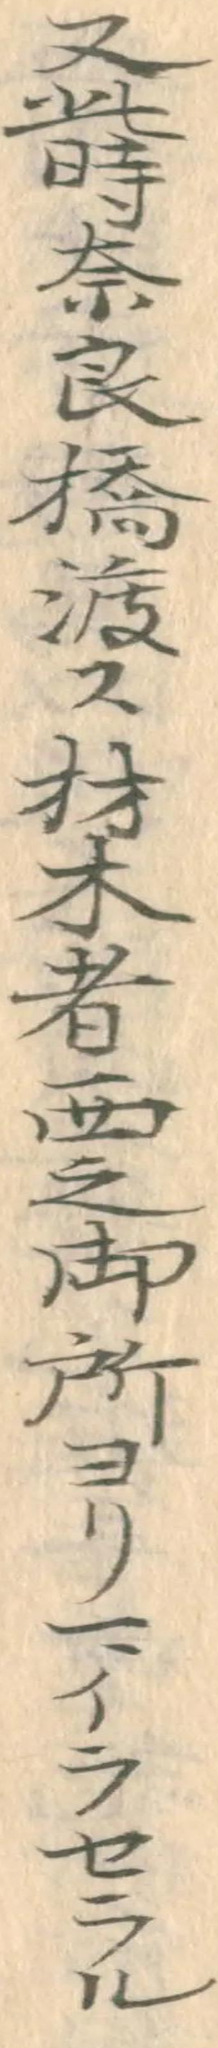又此時奈良橋渡ス材木者西之御所ヨリマイラセラル
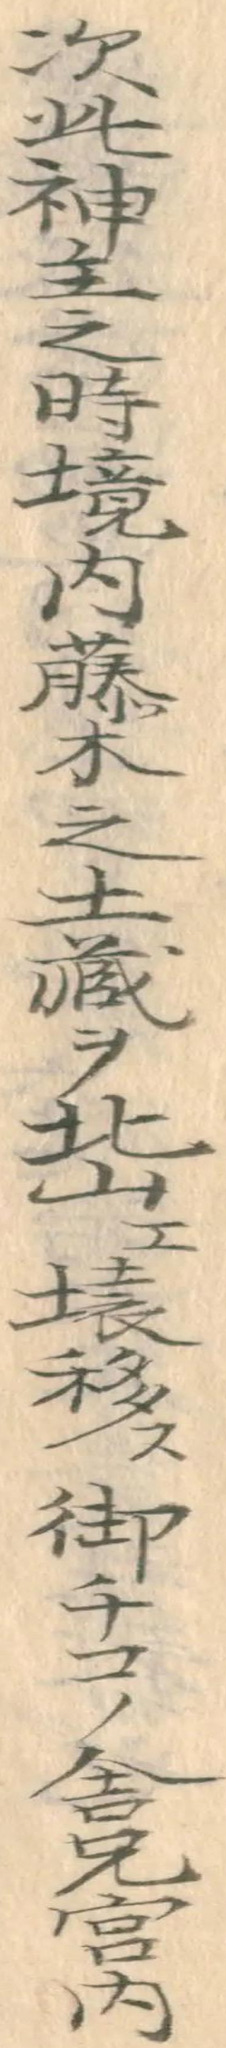次此神主之時境内藤木之土蔵ヲ北山エ壊移ス御チコノ舎兄宮内
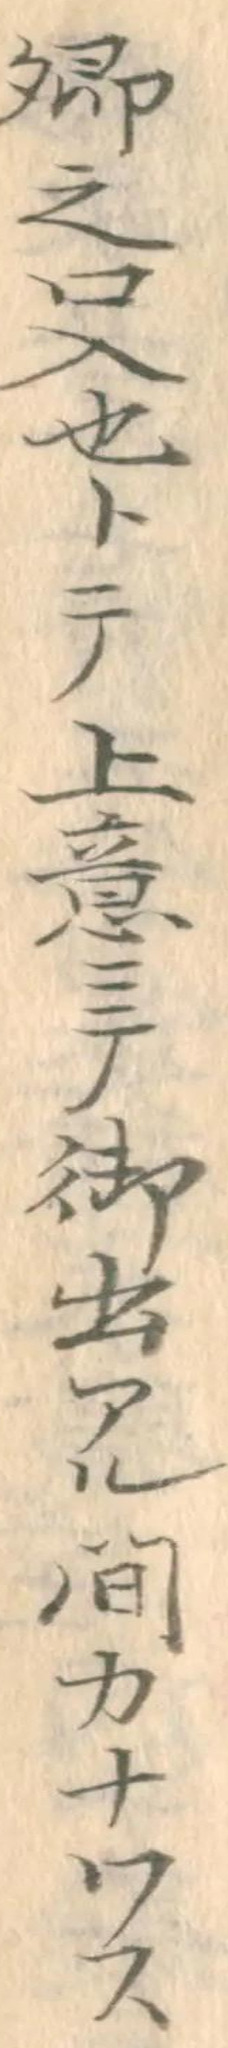卿之口入也トテ上意ニテ御出アル間カナワス
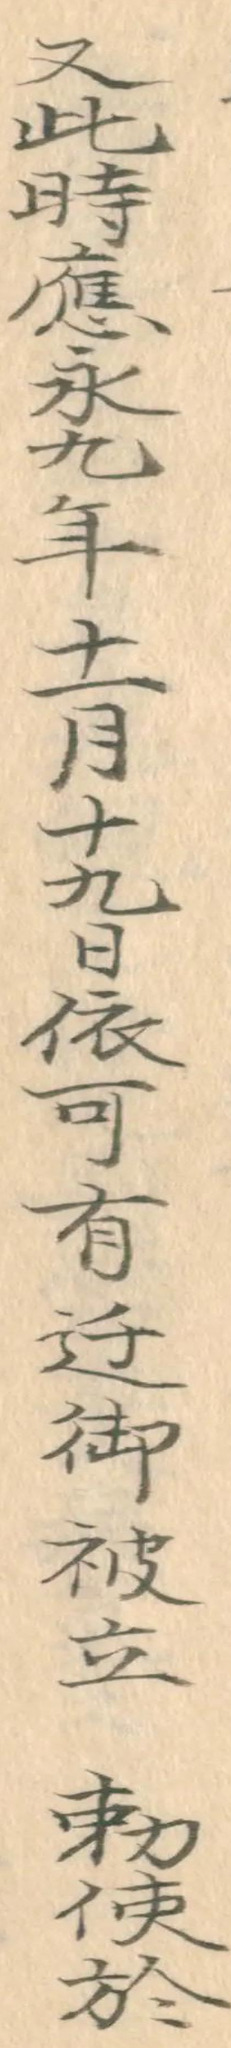又此時応永九年十一月十九日依可有遷御被立勅使於
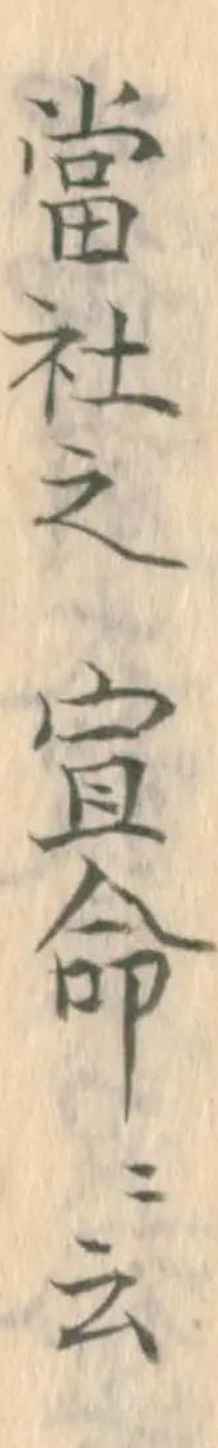当社之宣命ニ云
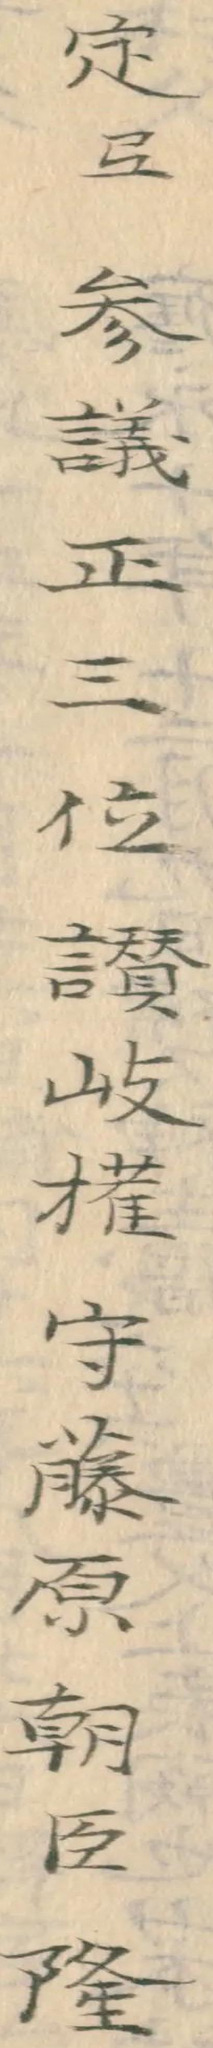定弖参議正三位讃岐権守藤原朝臣隆
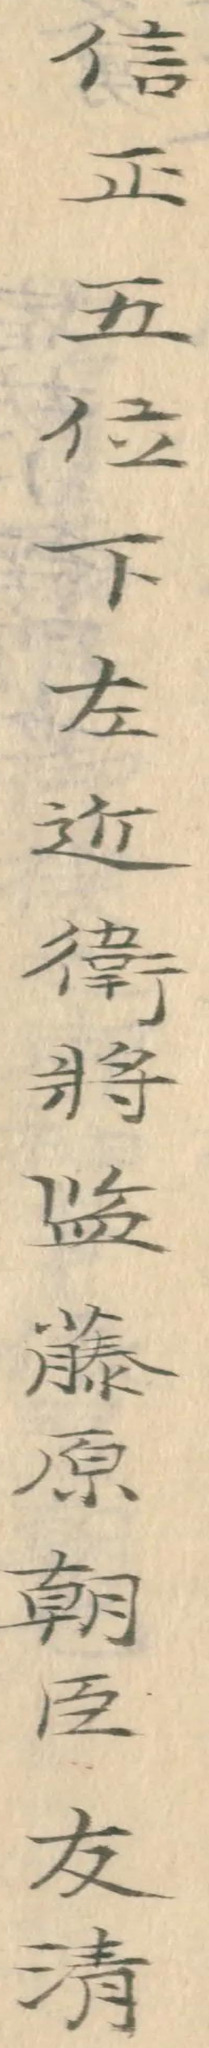信正五位下左近衛将監藤原朝臣友清

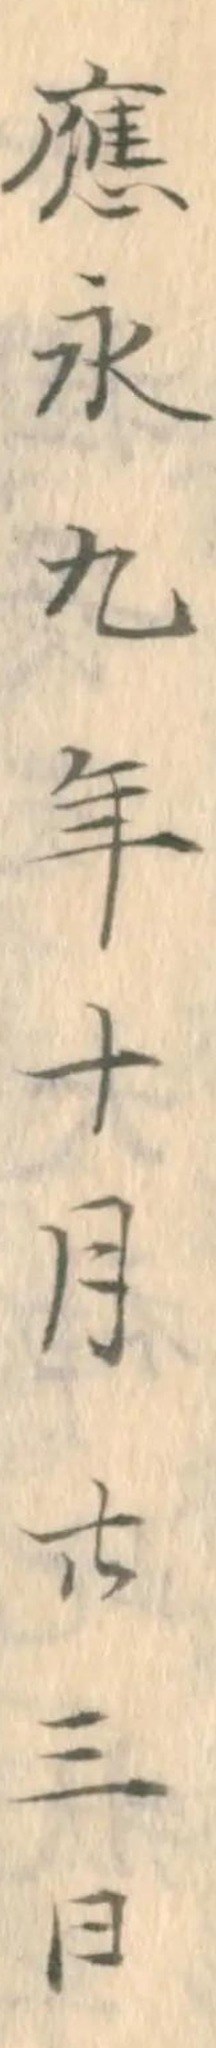応永九年十月廿三日
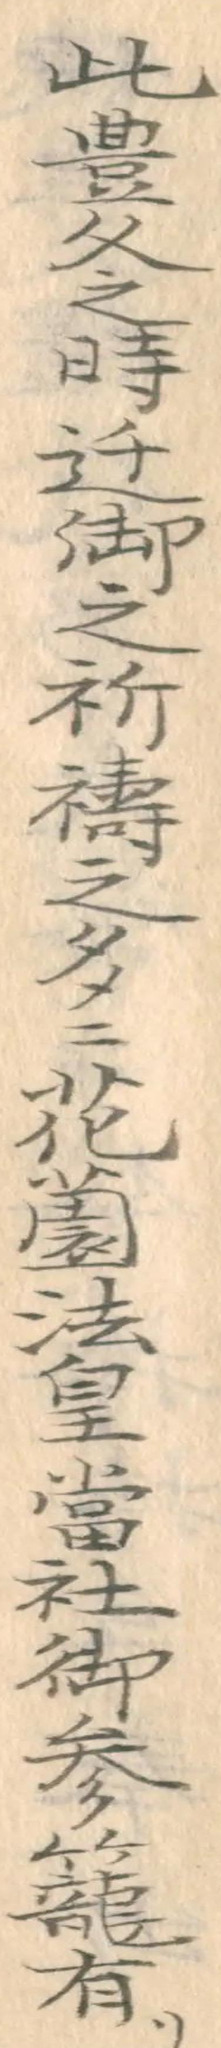此豊久之時遷御之祈祷之多ニ花薗法皇当社御参籠有リ
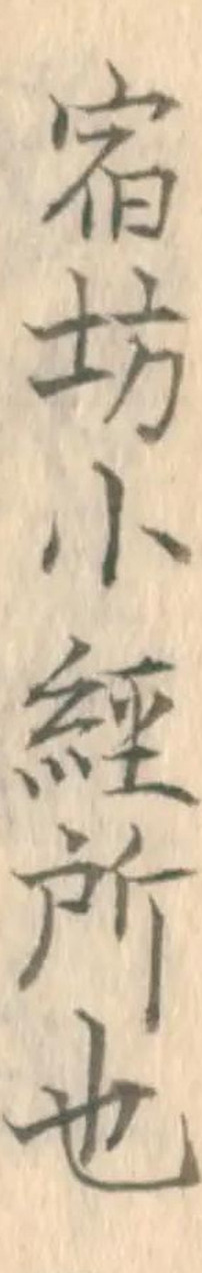宿坊小経所也
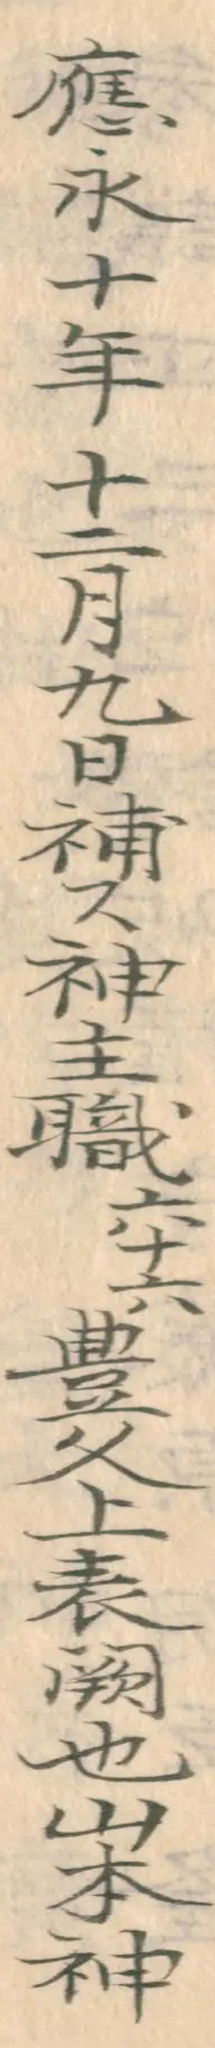応永十年十二月九日補ス神主職六十六豊久上表闕也山本神
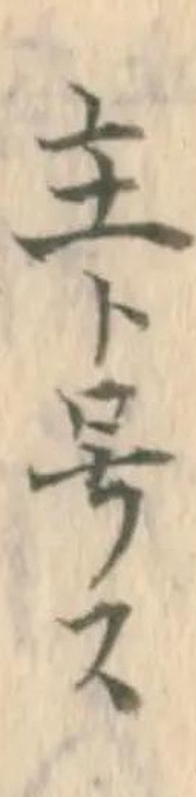主ト号ス
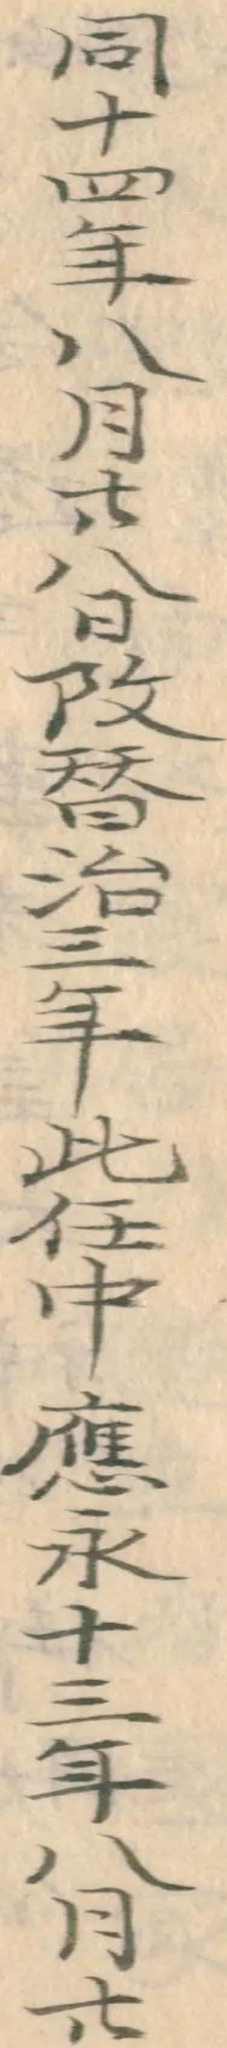同十四年八月廿八日改替治三年此任中応永十三年八月廿
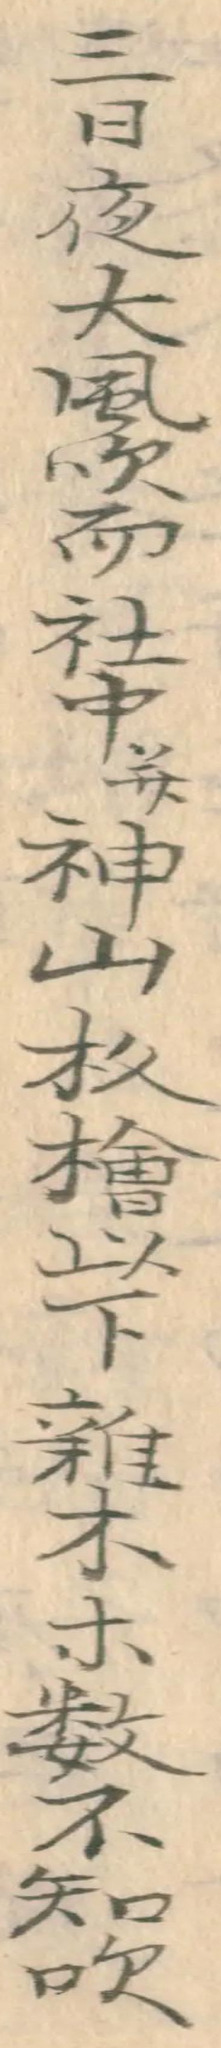三日夜大風吹而社中并神山杉檜以下雑木等数不知吹
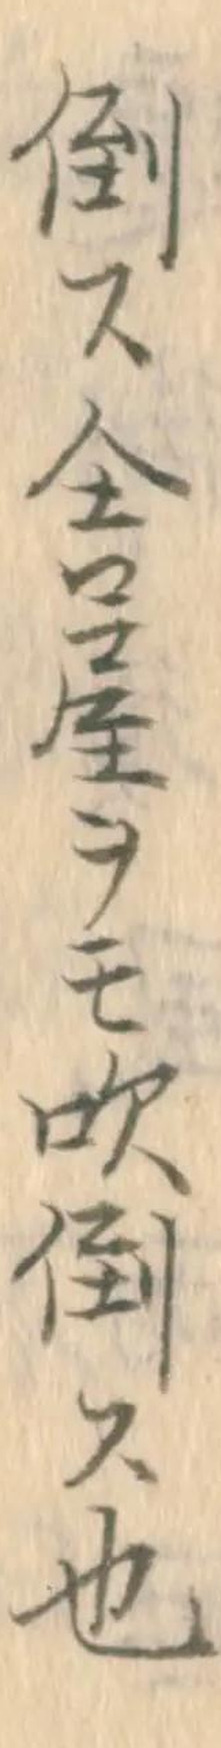倒ス舎屋ヲモ吹倒ス也
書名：賀茂社記録. 第24冊
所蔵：国立国会図書館 National Diet Library, JAPAN
